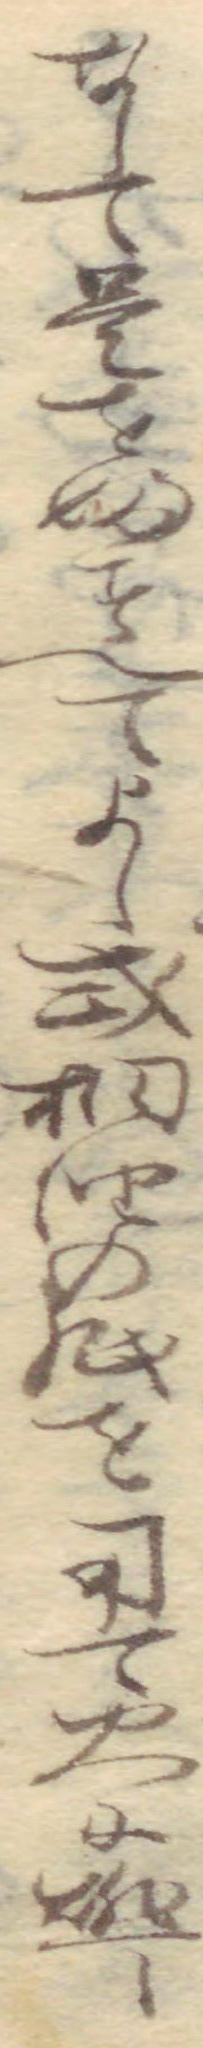なして是をふすへてよし或桐油の紙を用いて火に燃し
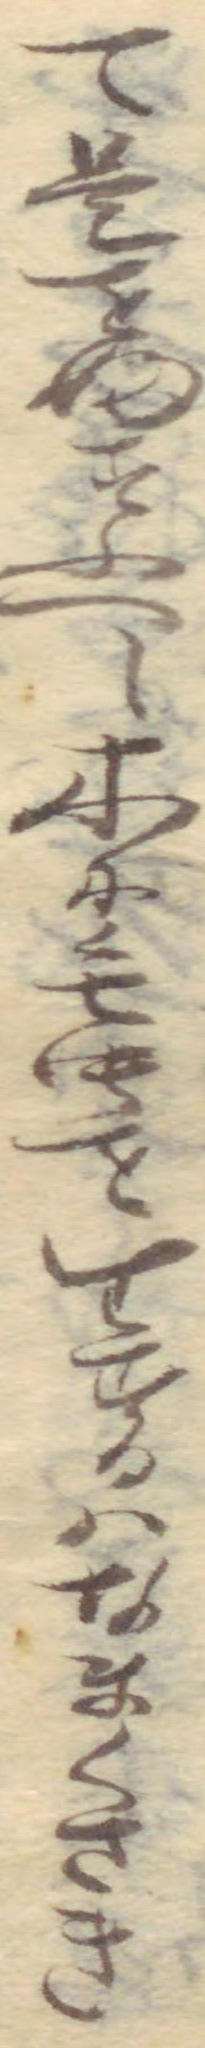て是をふすふへし木に其虫を生するハなまくさき
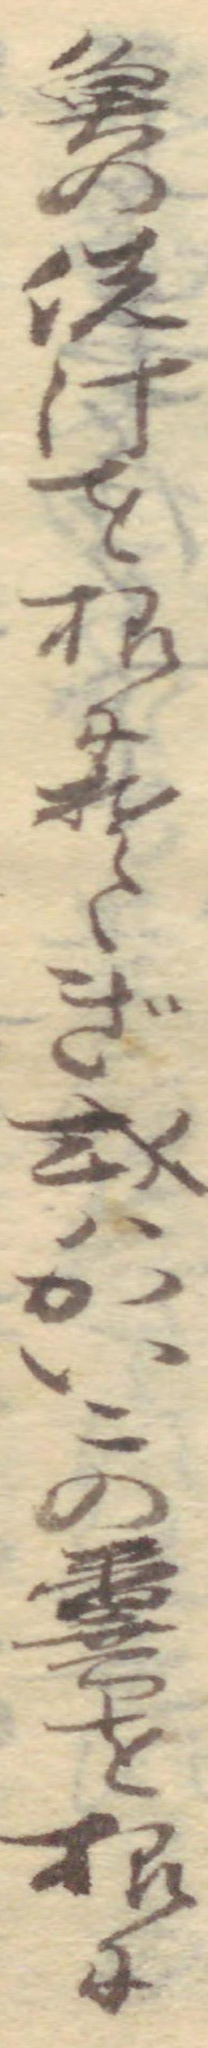魚の洗汁を根にそゝぎ或ハかいこの糞を根に
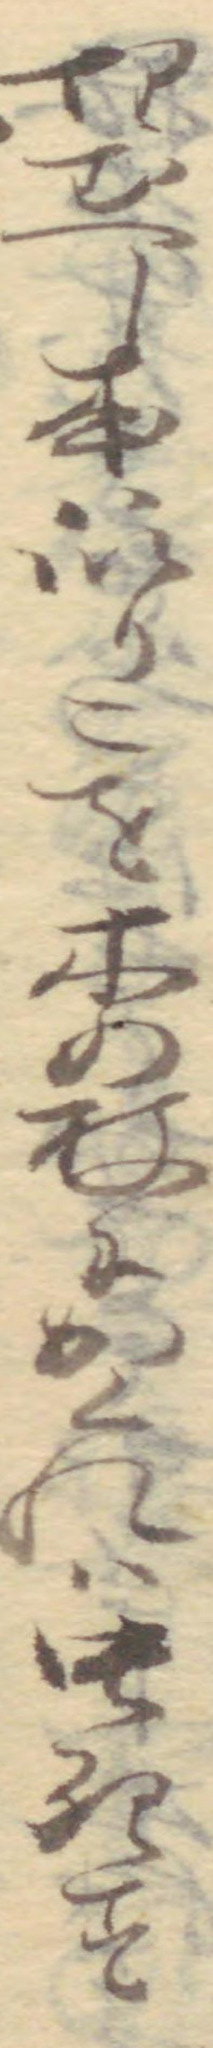埋むへし或ハいりこを木の枝にかくれハ虫死す
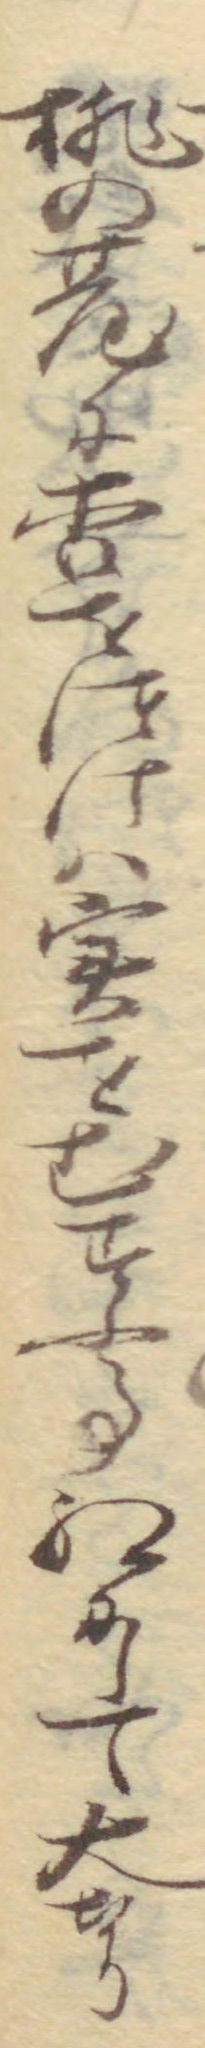一桃の臺に杏をつけハ実をむすふ事紅にして大なり
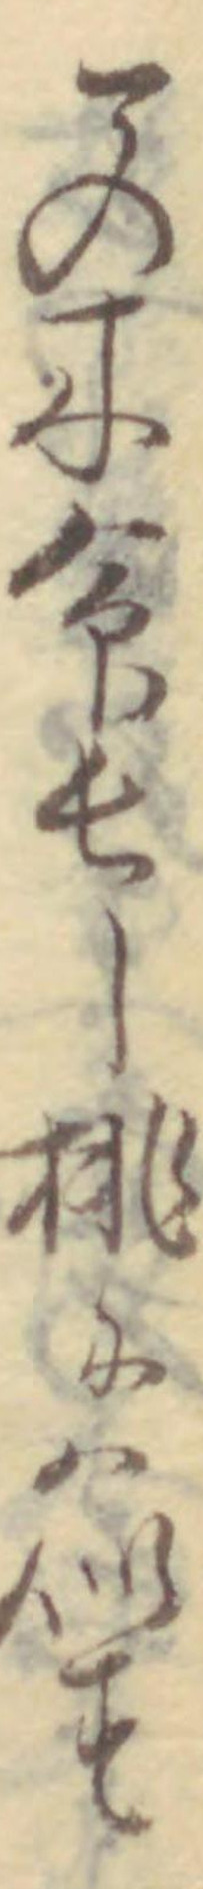この木命長し桃にハ似す
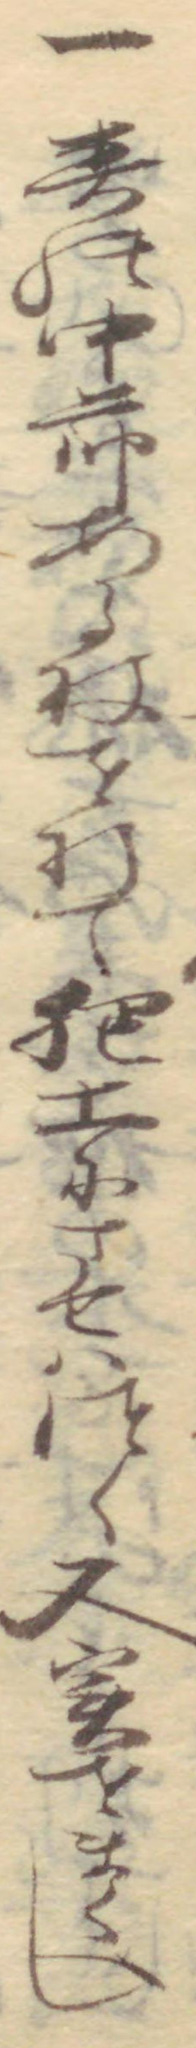一春の中節ある枝を打て肥土にさせハつく又実をまくへし
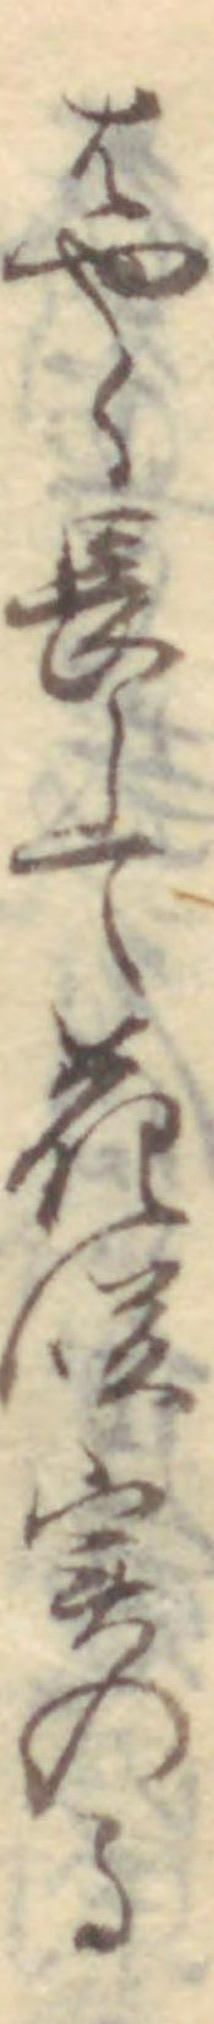はやく長して花咲実のる
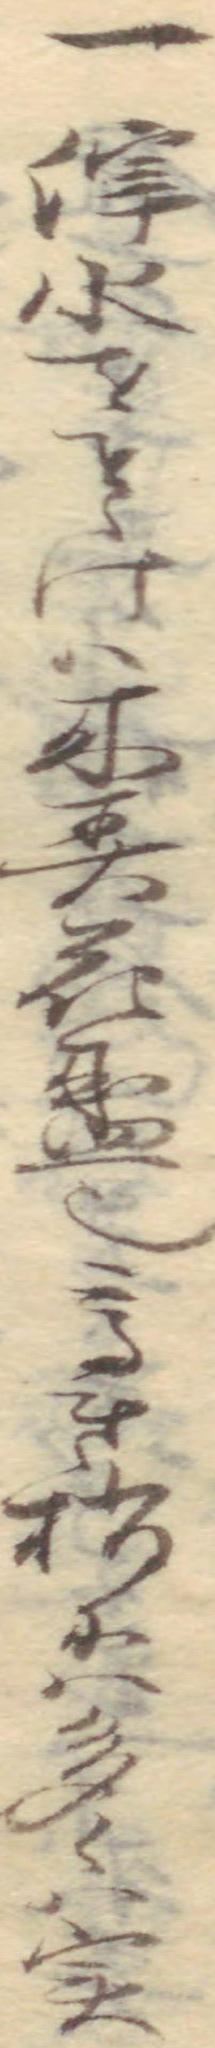一滓水をそゝけは来春花盛也高き梢にハ多くハ実
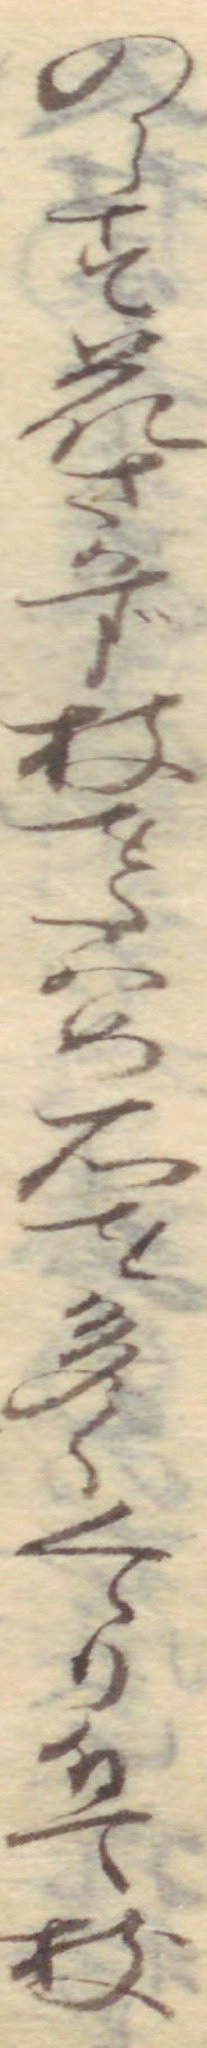のらす花さかず枝をたハめ石を多くくゝり付て枝
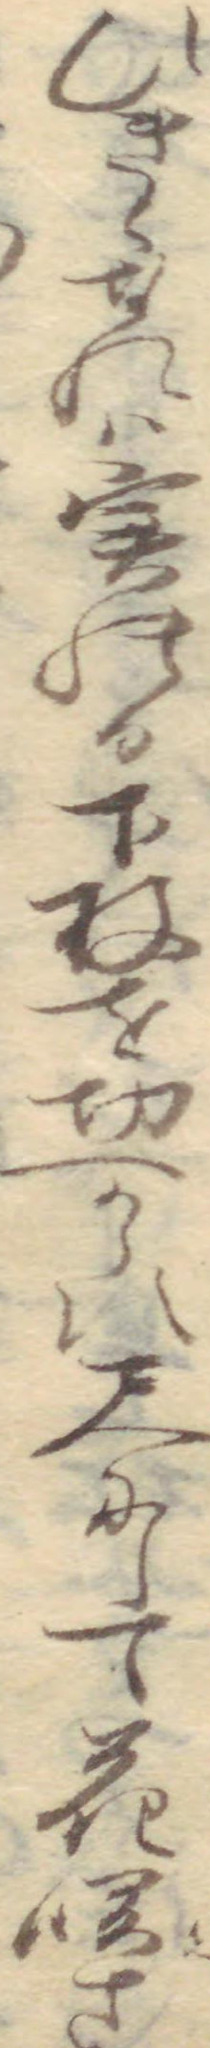ひきくなれハ実のる下枝を切へからす尺にして花咲さ
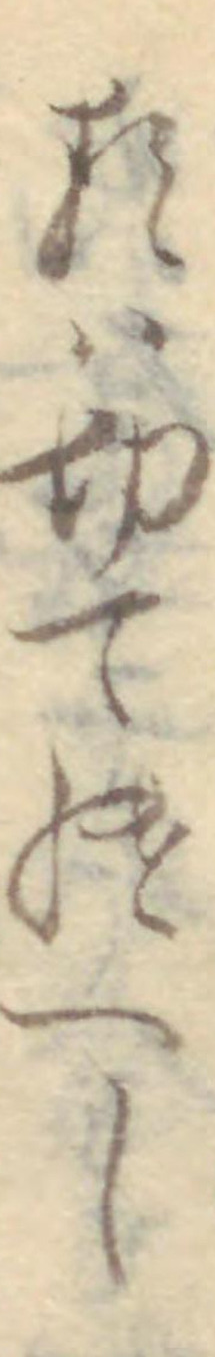るハ切て継へし
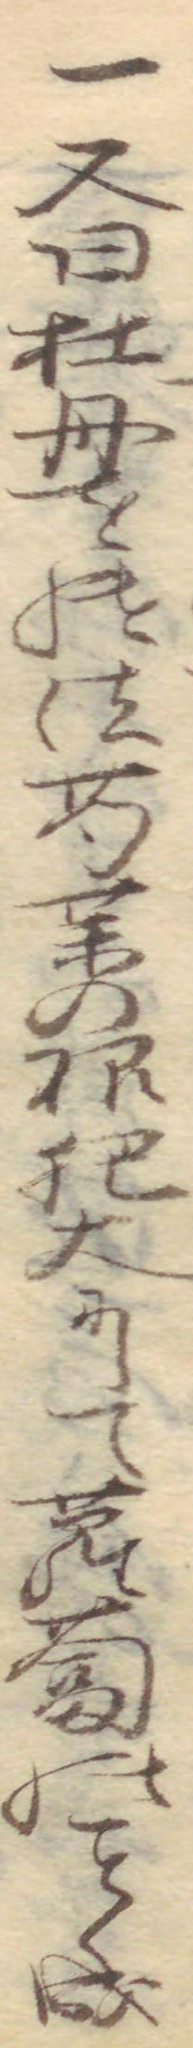一又曰牡丹を継法芍薬の根肥大にして蘿蔔のことく成
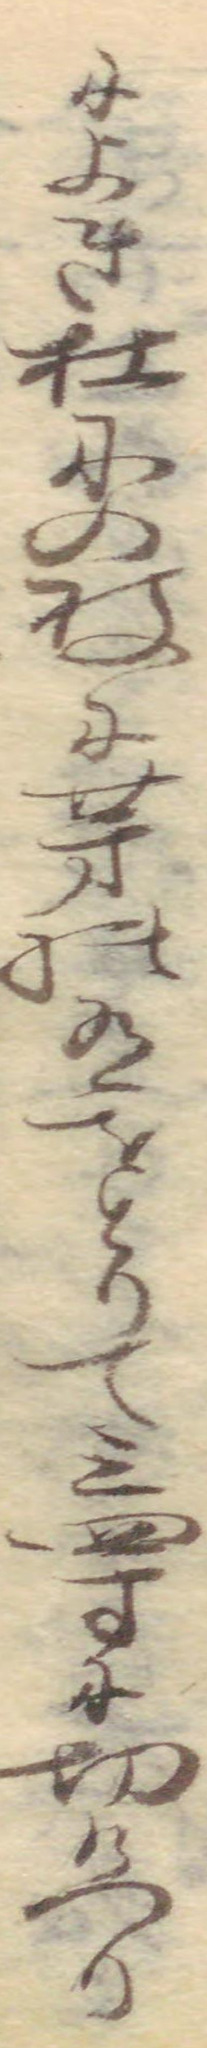によき杜木の枝に芽の有をとりて三四寸に切けつり
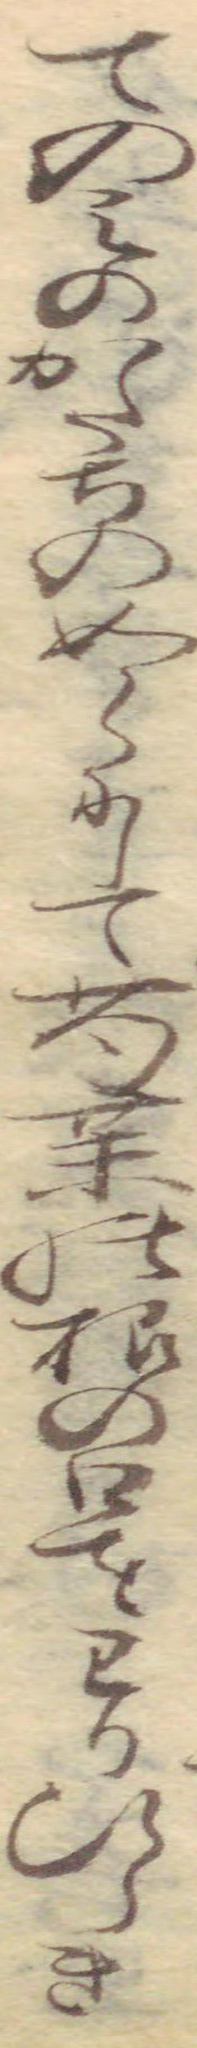てのミのかたちの如くにして芍薬の根の口をわりひらき
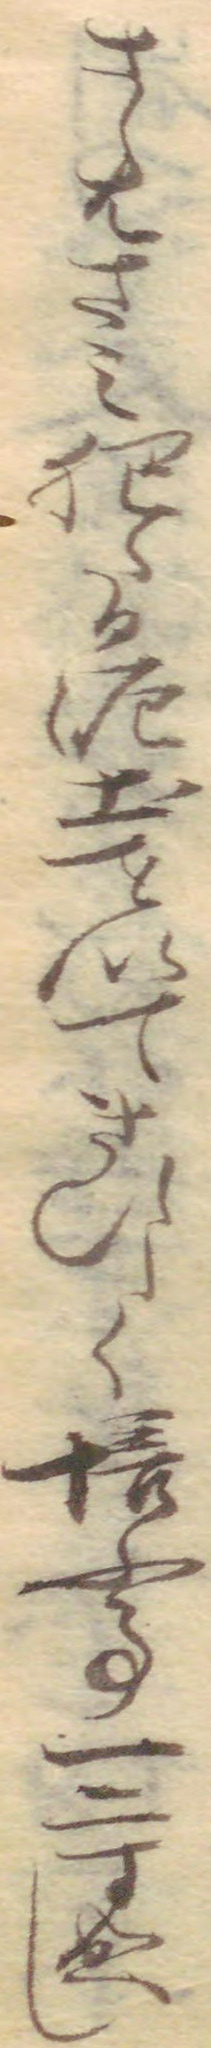さしはさみ肥たる泥土を以てきひしく培ふ事一二寸成へし
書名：鶯宿雑記. 巻199-200
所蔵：国立国会図書館 National Diet Library, JAPAN
